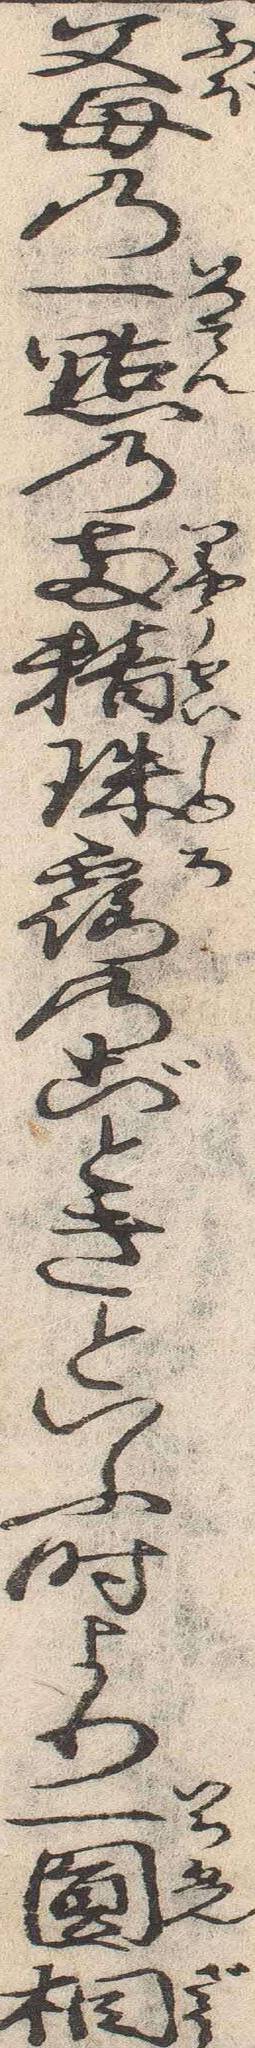父母の一點の両精珠露のごときといふ時より一圓相
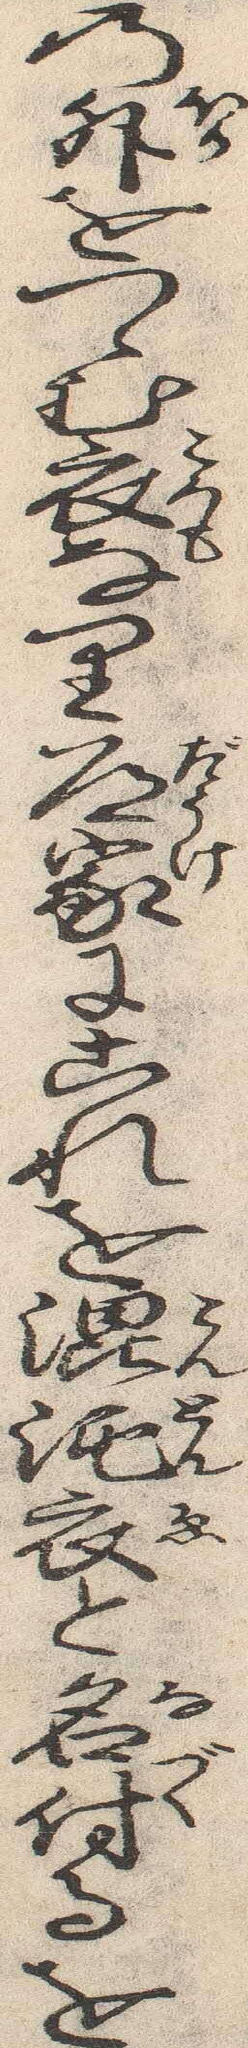の外をつゝむ衣なり道家にこれを混沌衣と名付るを
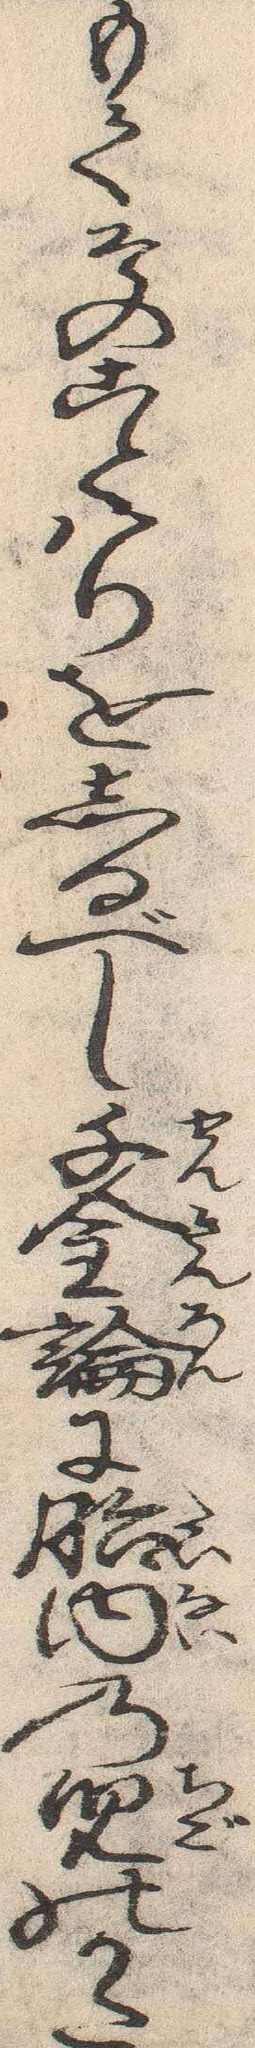もてそのことはりをしるべし千金論に胎内の児のかた
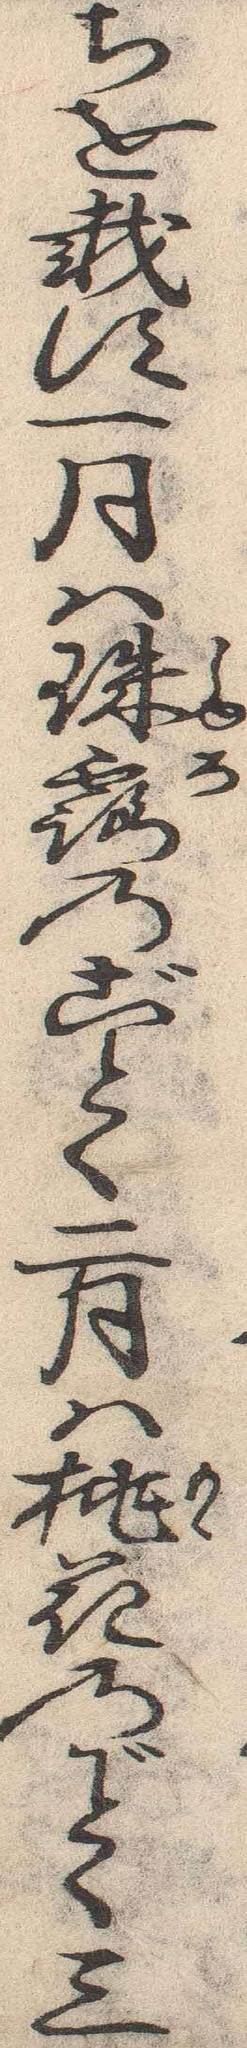ちを載す一月は珠露のごとく二月は桃花のごとく三
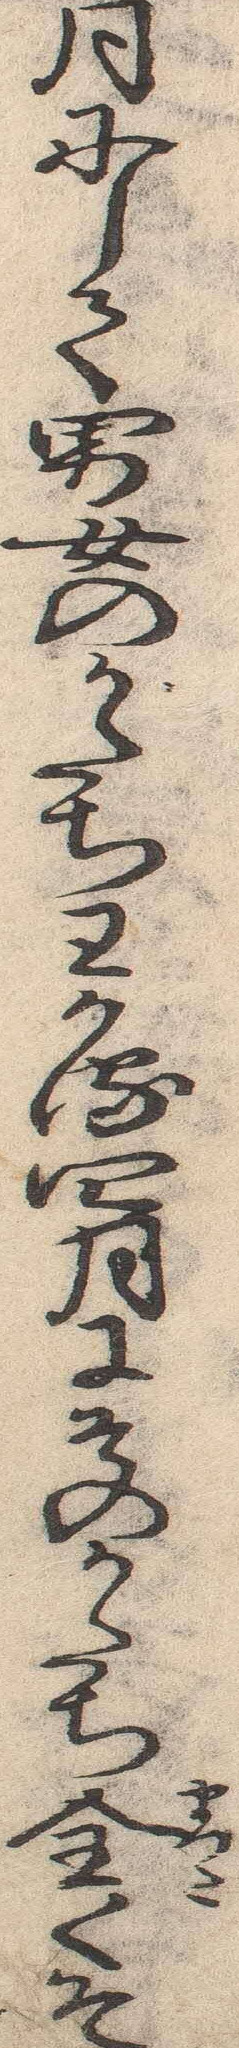月にして男女のかたちわかる四月にそのかたち全くそ
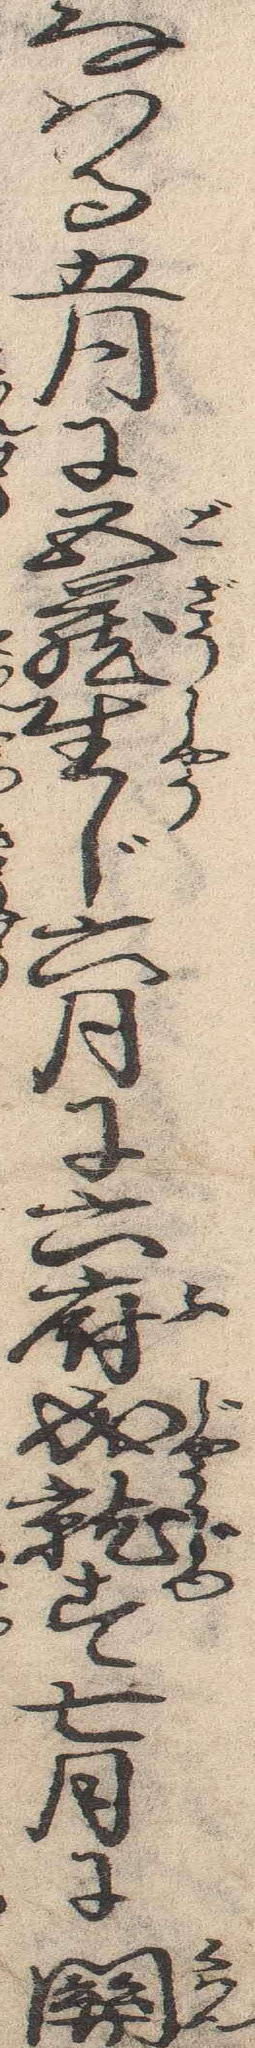なはる五月に五藏生じ六月に六府成就す七月に關

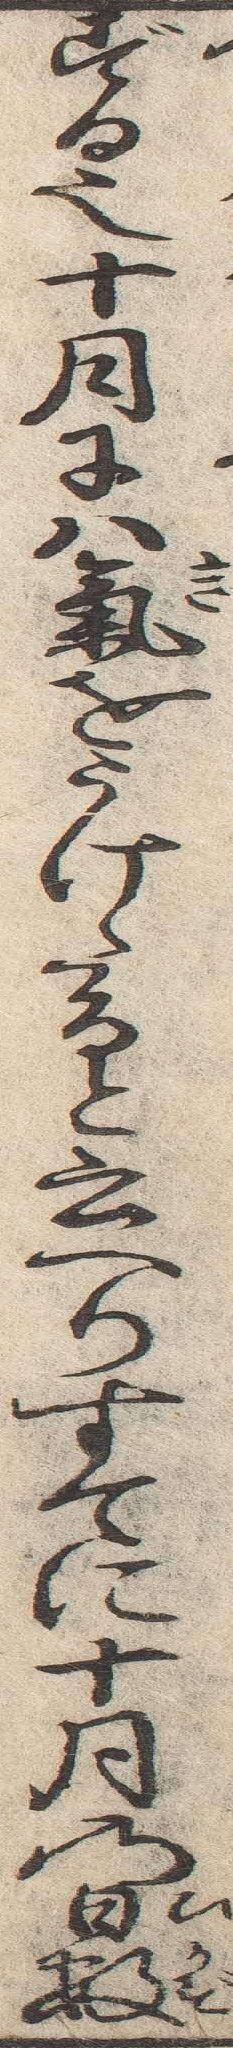ずる也十月には氣をうけたると云へりすてに十月の日数
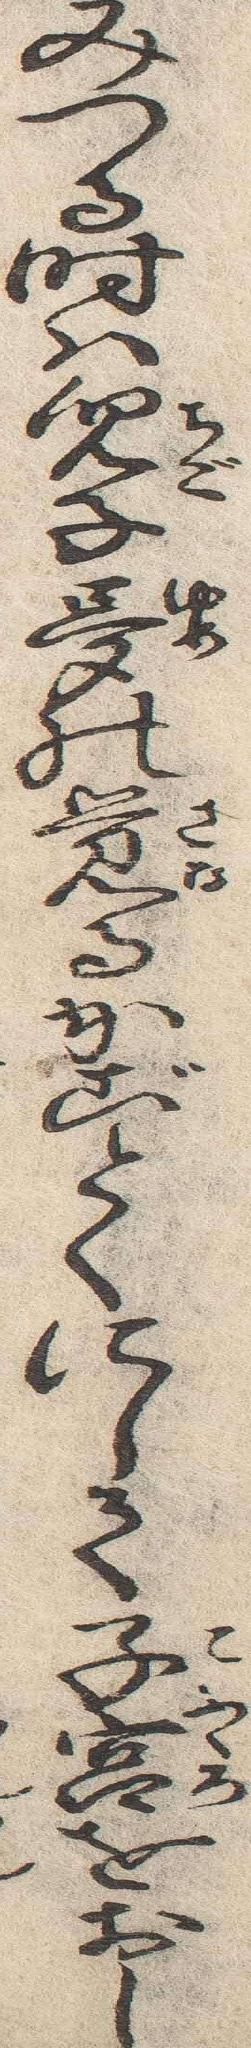みつる時は児子夢の覚るかごとくにして子宮をおし
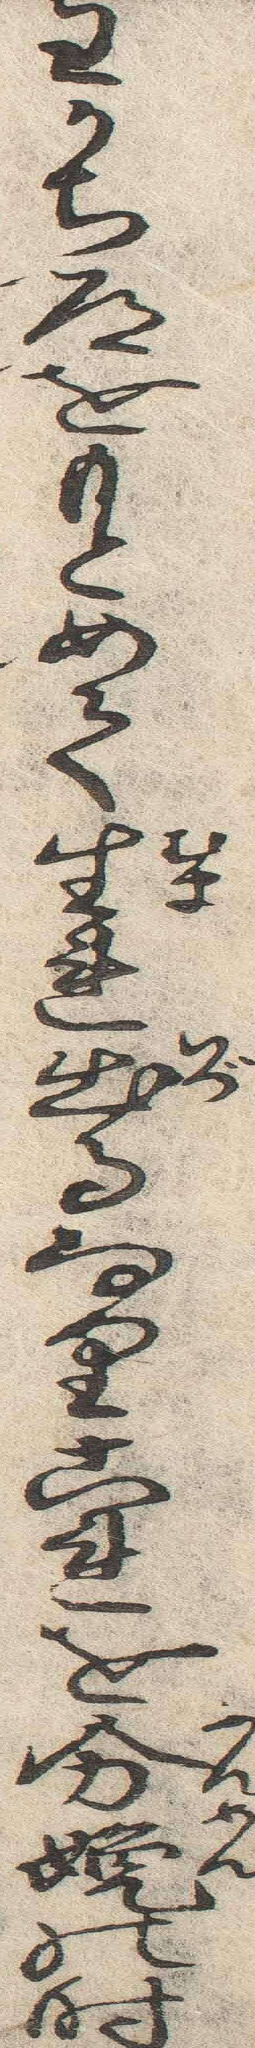わかち道をもとめて生れ出るなりこれを分娩の時
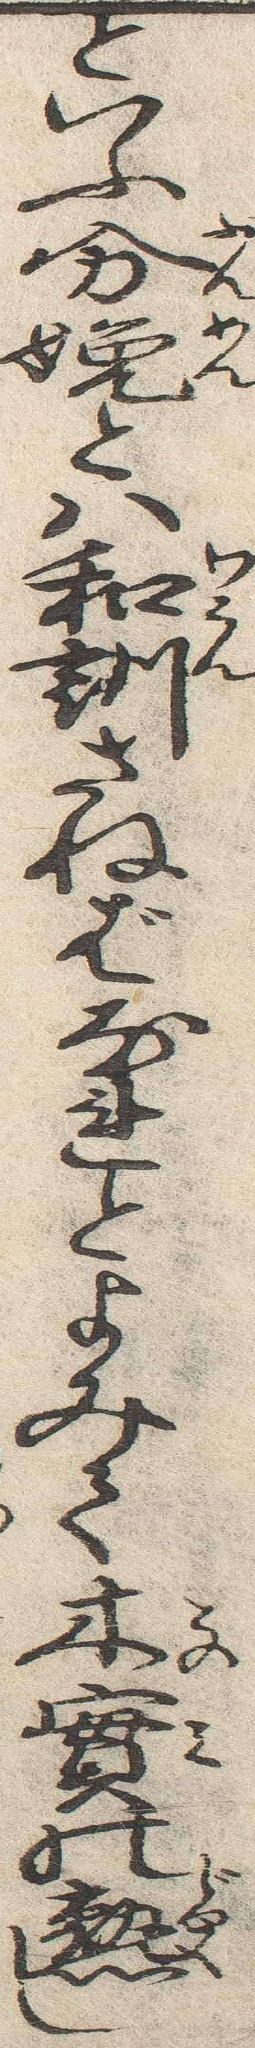といふ分娩とは和訓さねばなれとよみて木實の熟し
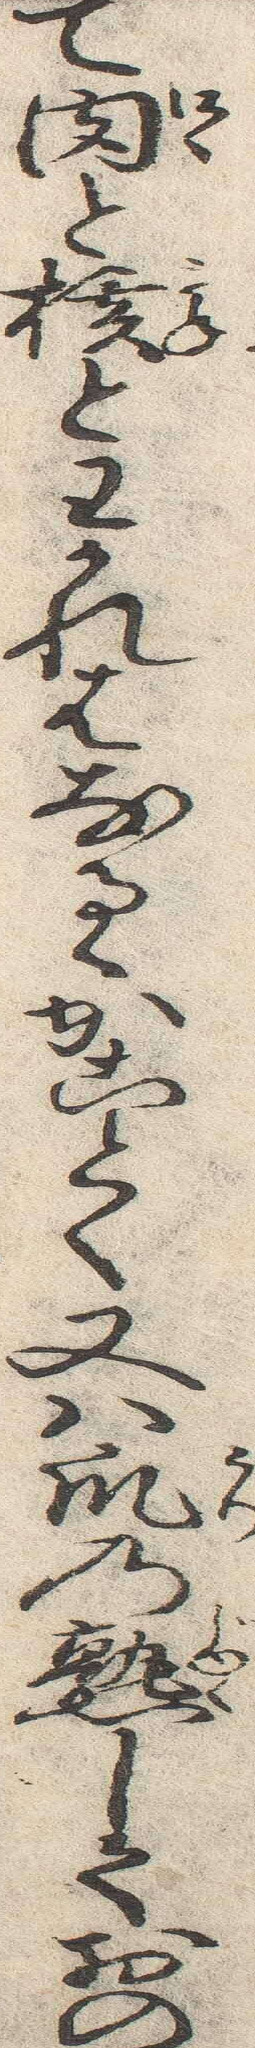て肉と核とわかれはなるゝかことく又は瓜の熟しておの
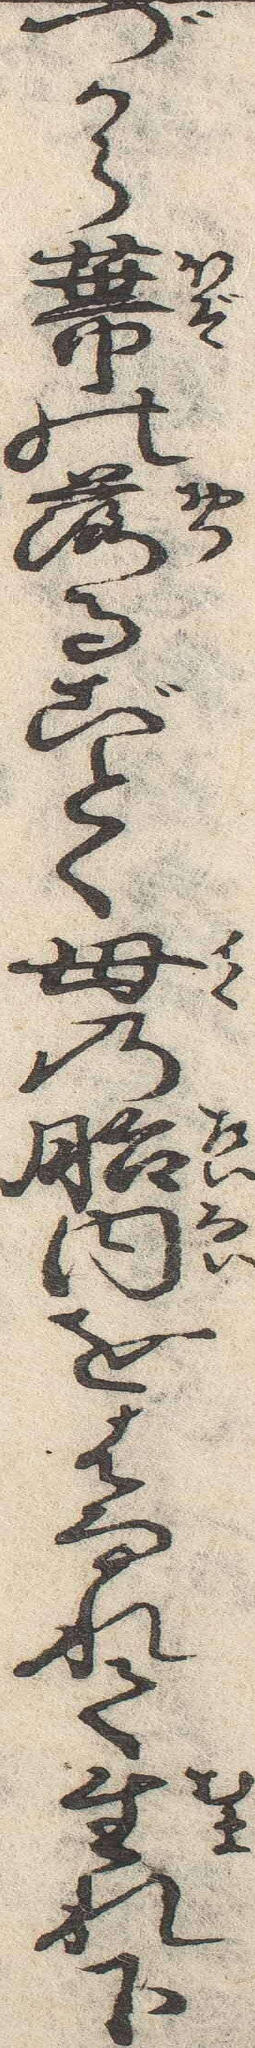づから蔕の落るごとく母の胎内をはなれて生れ下
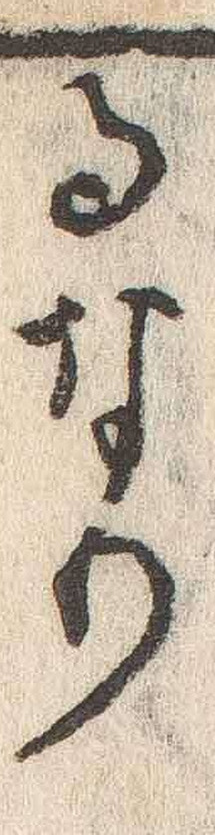るなり
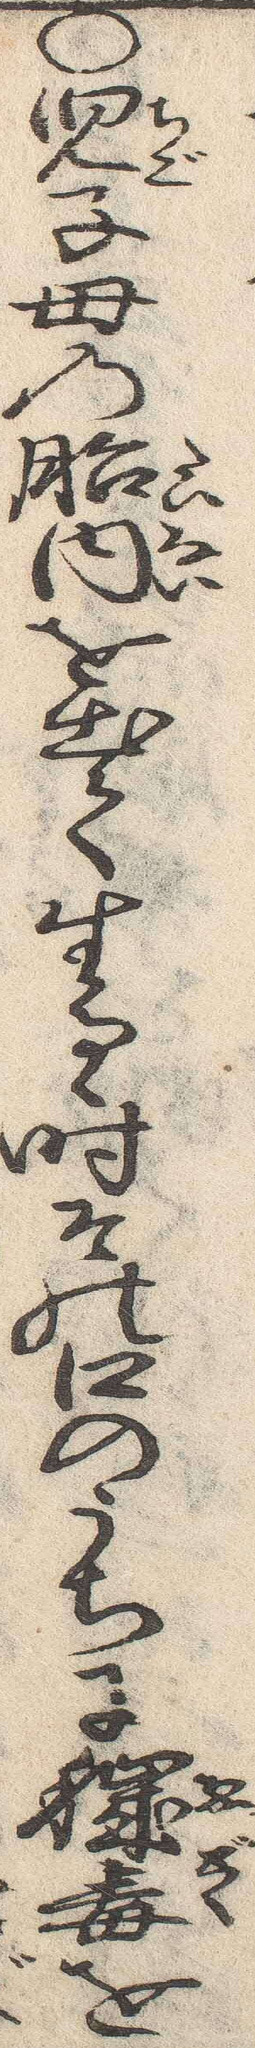◯児子母の胎内を出て生るゝ時その口のうちに穢毒を
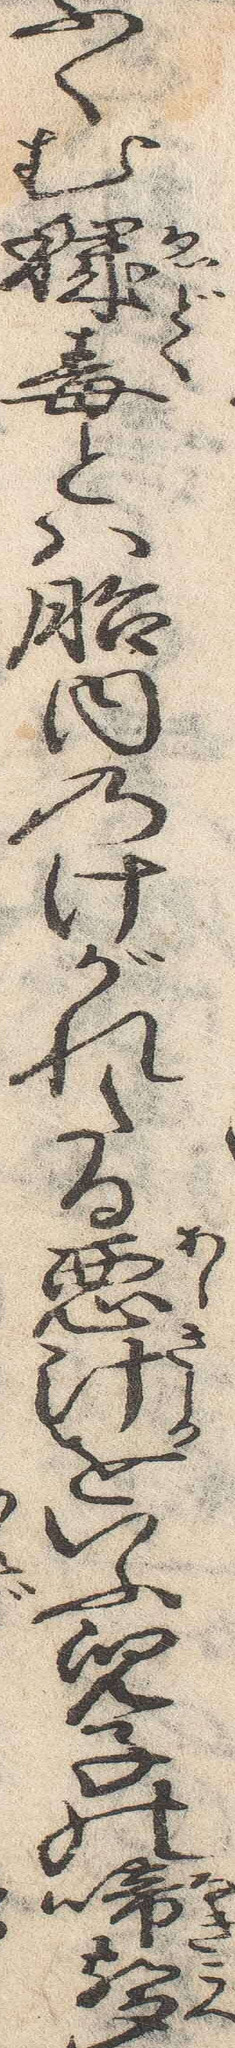ふくむ穢毒とは胎内のけがれたる悪汁をいふ児子の啼聲
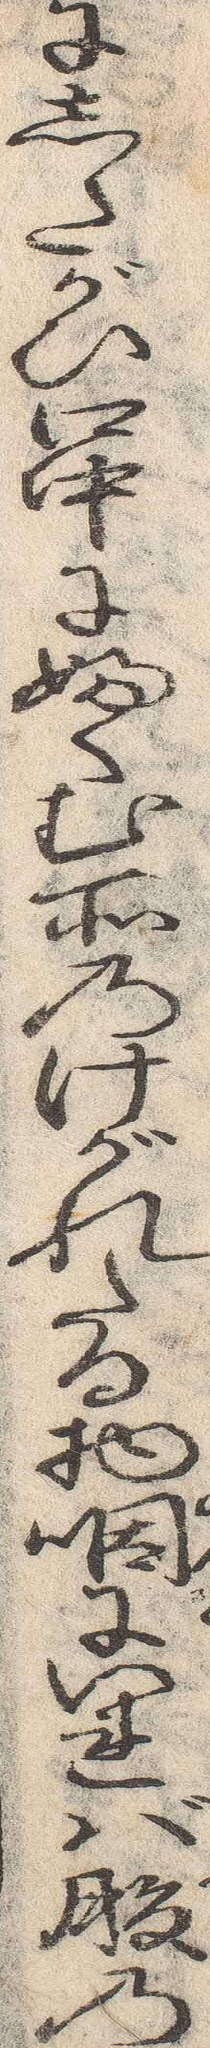にしたがひ口中にふくむ所のけがれたる物咽にいれば腹の
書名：小児必用養育草
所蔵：東京学芸大学附属図書館 国文学研究資料館
